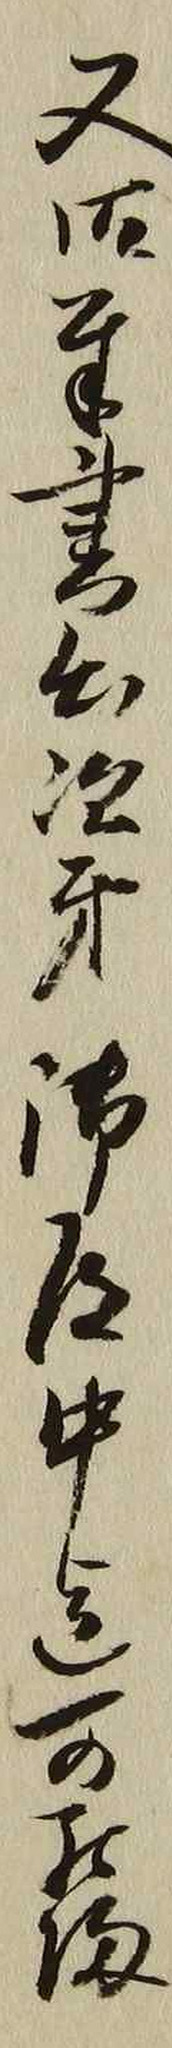又御奉書出次第御道中迄可罷帰
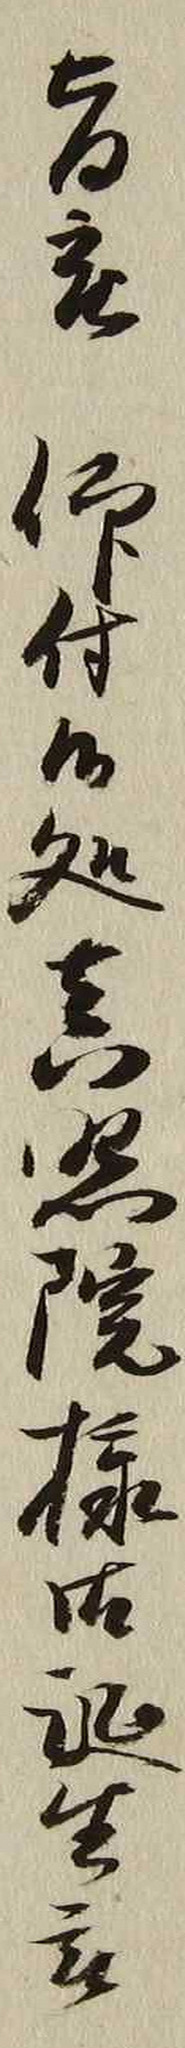旨被仰付候処真照院様御誕生被
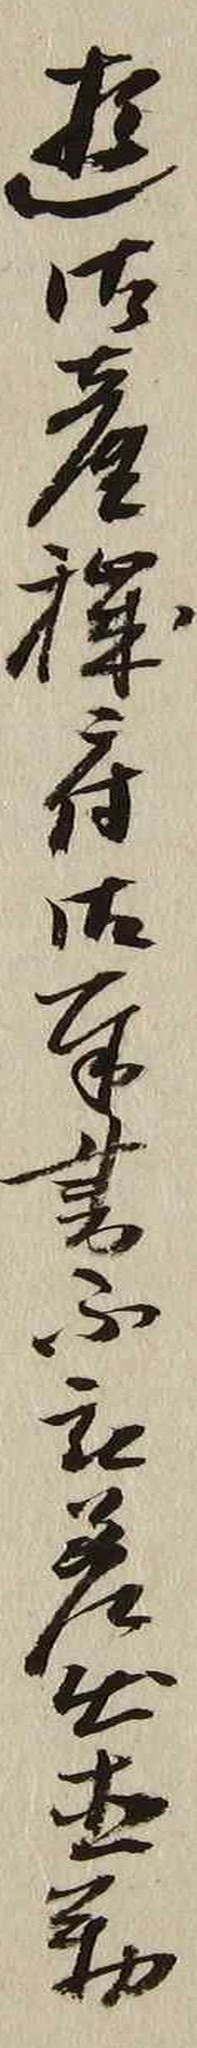遊御産穢ニ付御奉書不被差出直勤
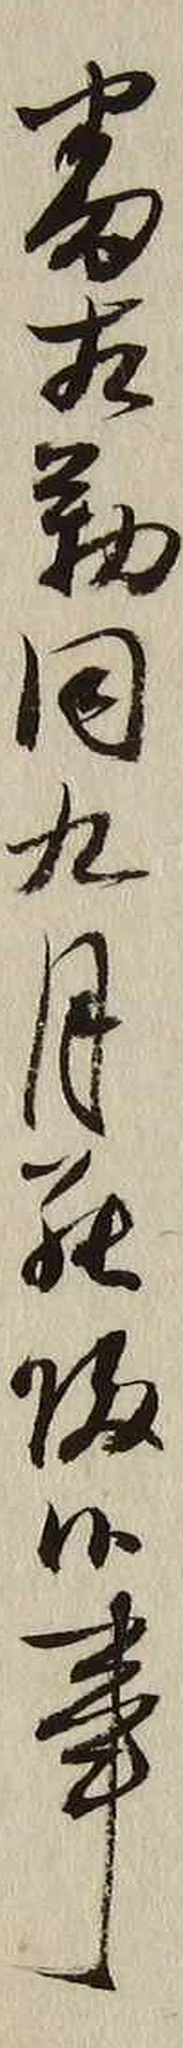番相勤同九月罷帰候事
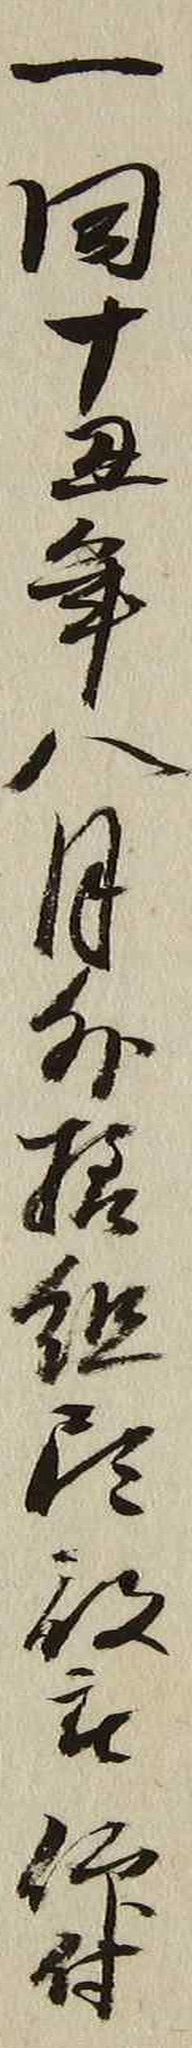一同十丑年八月外様組頭役被仰付
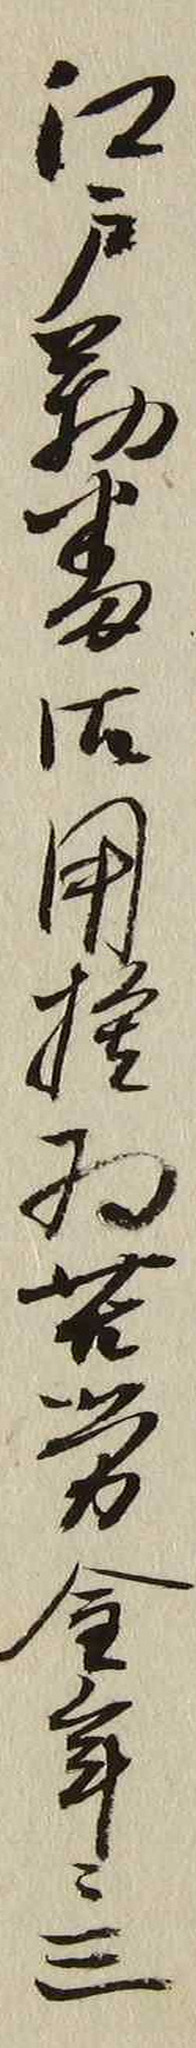江戸勤番御用捨為苦労金年々三
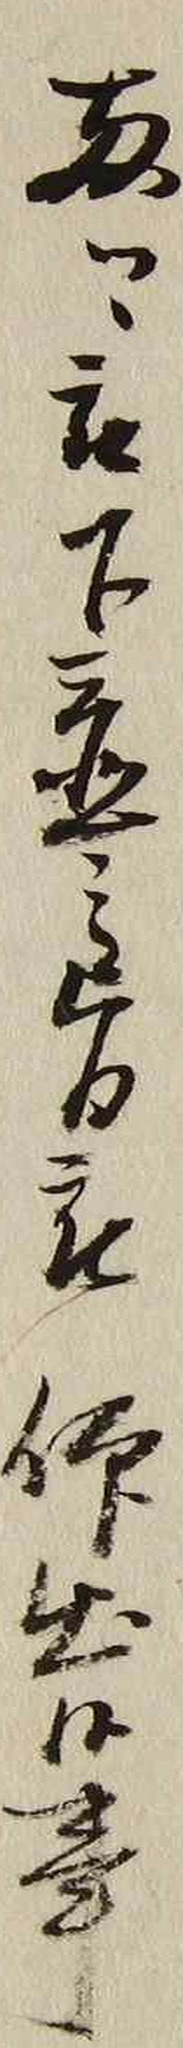両ツヽ被下置之旨被仰出候事
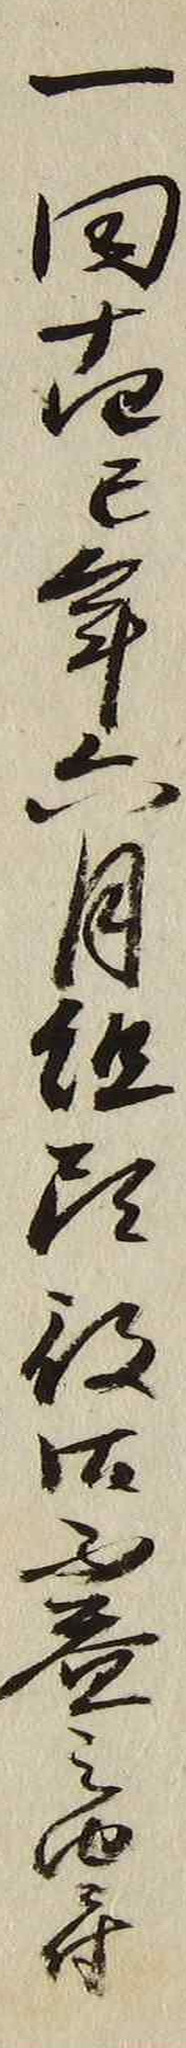一同十四巳年六月組頭役御不益之由ニ付
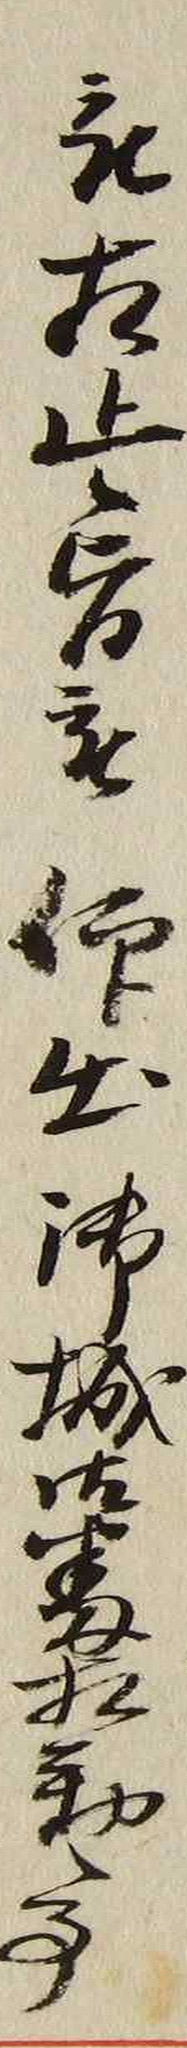被相止候旨被仰出御城御番相勤候事
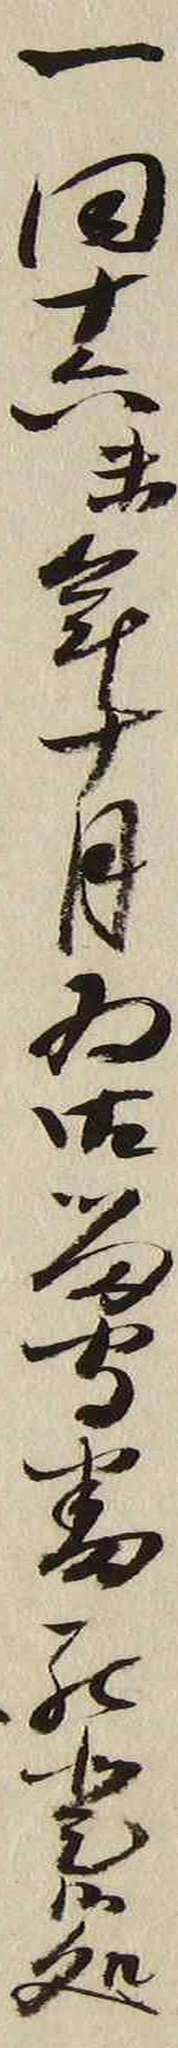一同十六未年十月為御留守番罷登候処
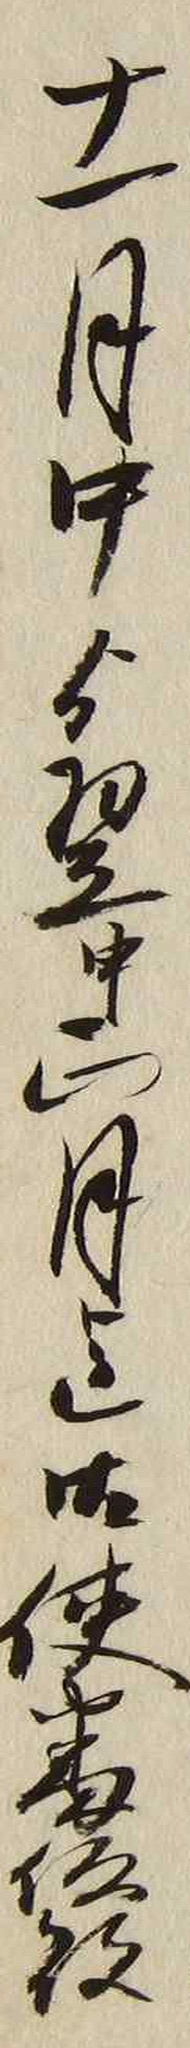十一月中ゟ翌申正月迄御使番仮役

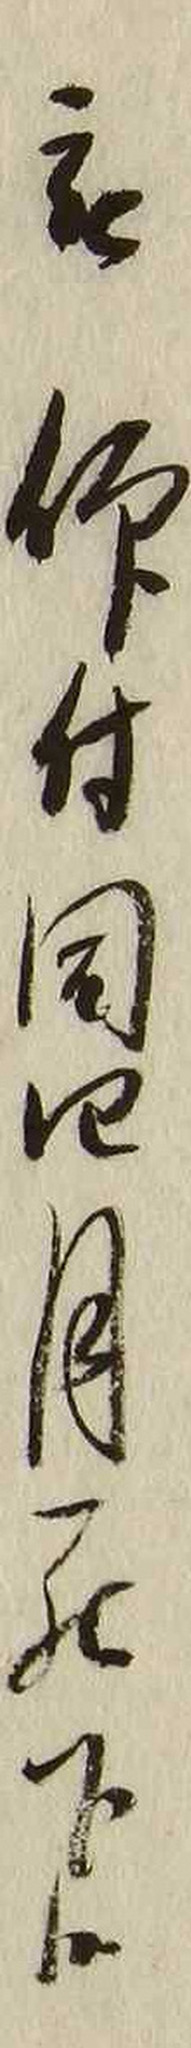被仰付同四月罷下候
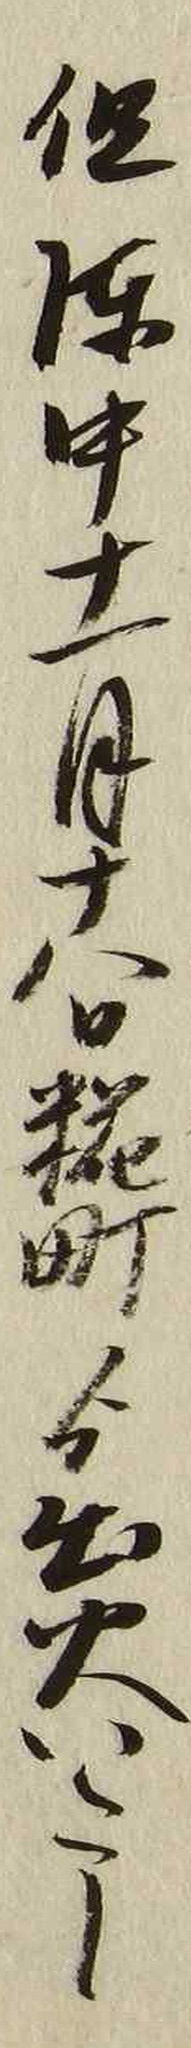但陳中十一月十八日糀町ゟ出火いたし
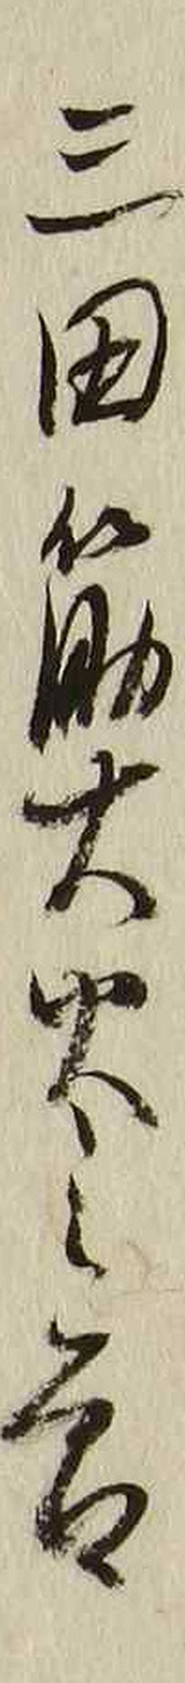三田筋大火之節
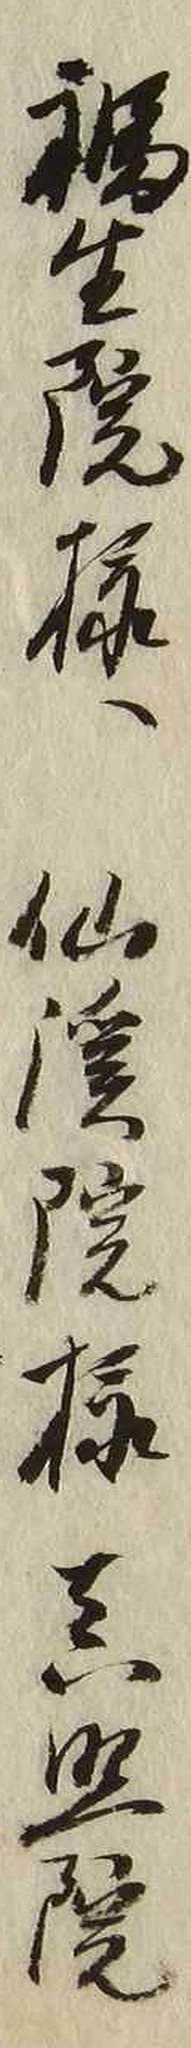福生院様へ仙渓院様真照院
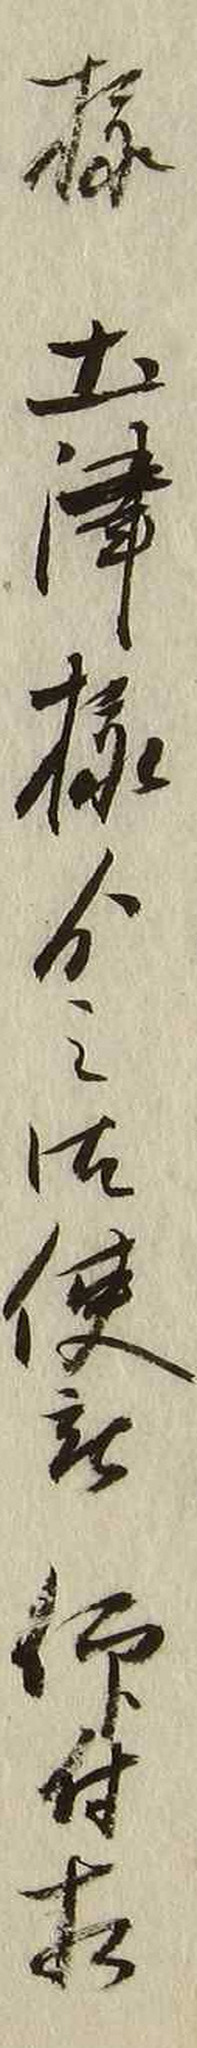様土津様ゟ之御使被仰付相
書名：諸士系譜　巻之356　す之部6
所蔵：会津若松市立会津図書館
